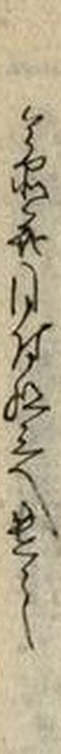兵衛幷目付組三人遣之
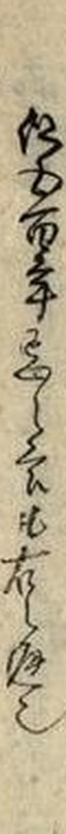但五百年忌之節も右之通也
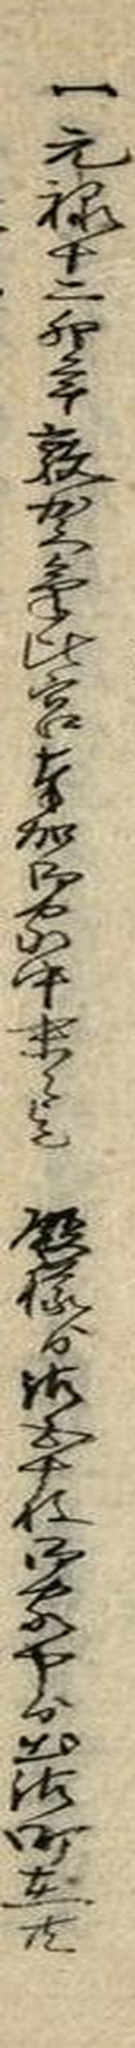一元禄十二卯年敦賀気比宮奉加御家中末々迄殿様ゟ銀五十枚御家中ゟ出銀町在共
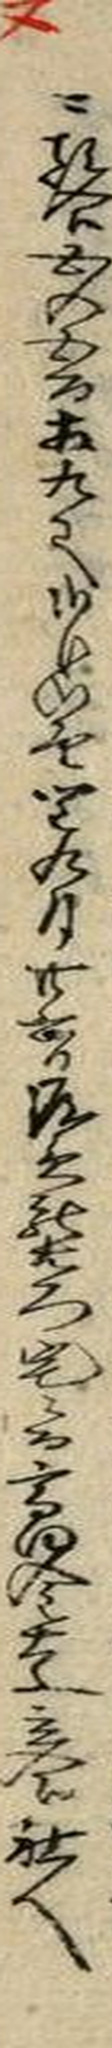ニ都合五貫五百拾九匁弐歩弐厘閏九月廿六日渥美新右衛門宅ニ而高田金太夫立合社人

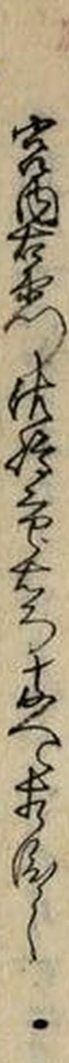宮内右衛門佐嶋市郎右衛門両人へ相渡之
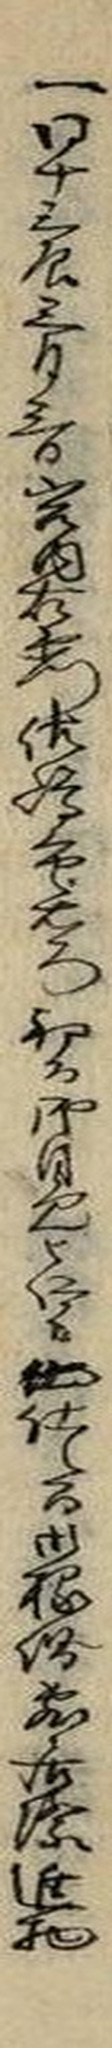一同十三辰三月三日宮内右衛門佐嶋市郎右衛門初而御目見被仰付出仕候間御縁側敷居際進物
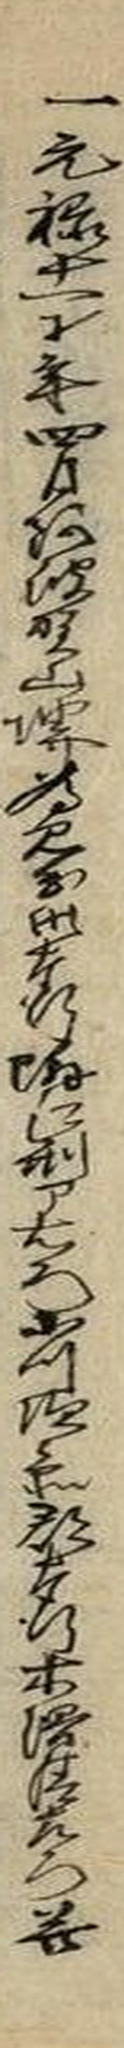一元禄十一寅年四月阿波賀山堺為見分御奉行蟹江刑部右衛門小川次兵衛郡奉行木滑清左衛門幷
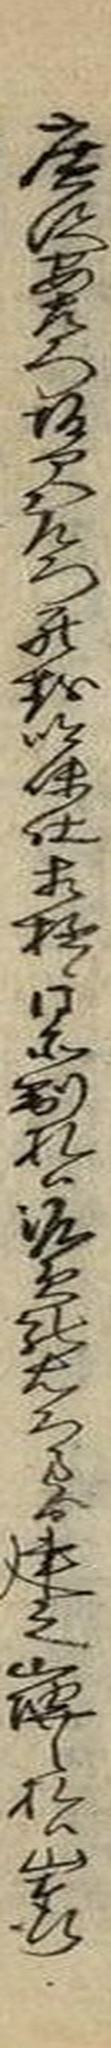広沢安左衛門坂部八左衛門罷越吟味仕相極候同所制札ハ渥美新右衛門方ゟ建之山堺之札ハ山奉行
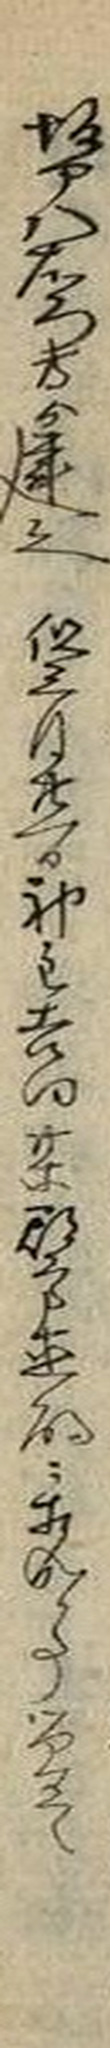坂部八左衛門方ゟ建之但三月廿一日神主吉田某郡方直触ニ相成候事留有之
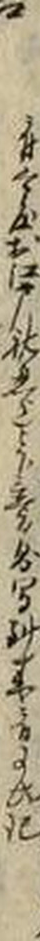ニ付今度於江戸祐忍迄被下置旨則写到来ニ付可此記
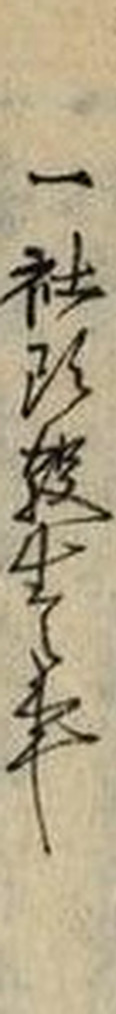一社頭殺生之事
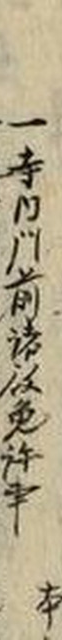一寺内門前諸役免許事
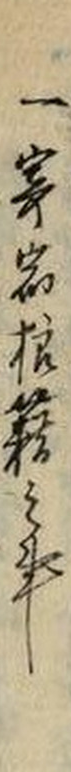一寄宿狼藉之事
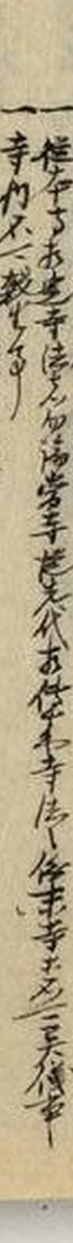一従本寺相定寺法者勿論当寺従先代相伝来寺法之儀末寺当等不可異議事
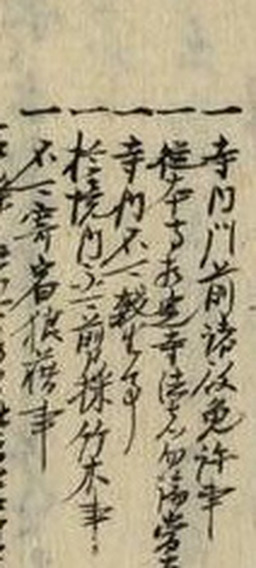一寺内不可殺生事
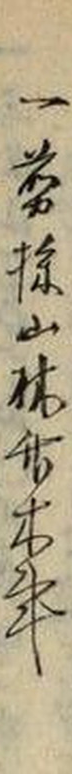一剪採山林竹木之事
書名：御国他国諸事之部
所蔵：福井県文書館 Fukui Prefectural Archives
